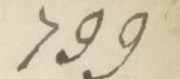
799
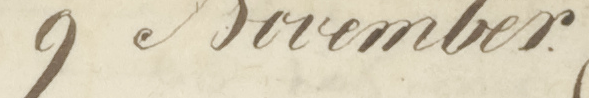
9 November.
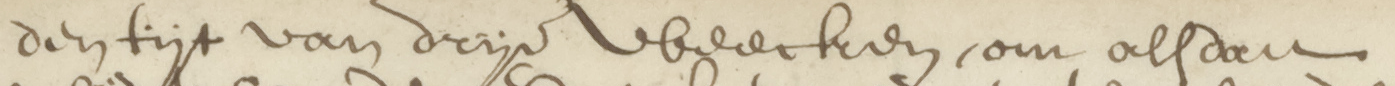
den tijt van drije weecken, om alsdan
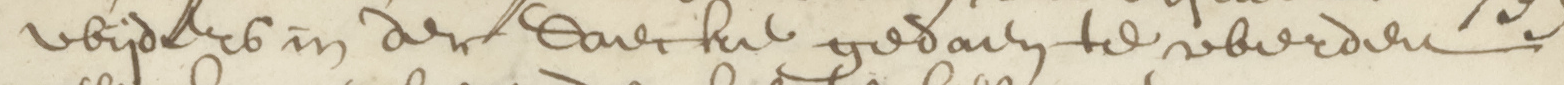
wijders in der Saecke gedaen te werden
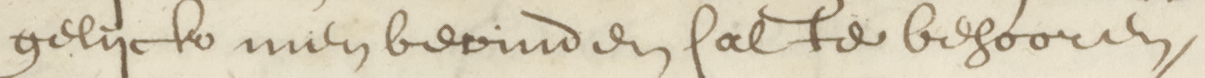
gelijck men bevinden sal te behooren.
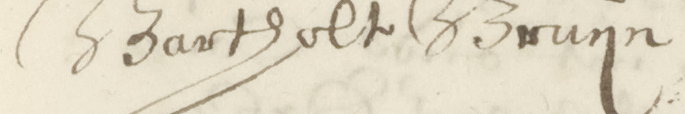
Bartholt Bruijn.
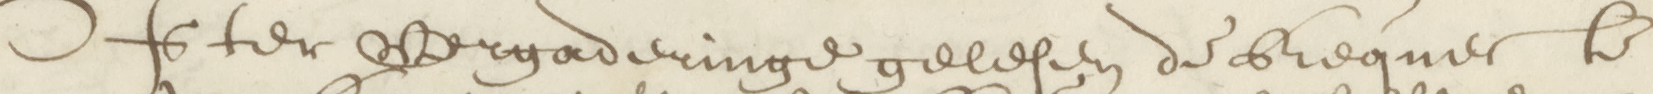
Is ter Vergaderinge gelesen de Requeste
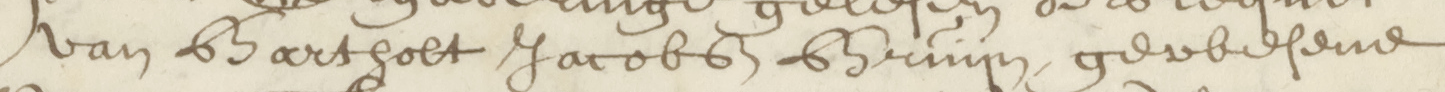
van Bartholt Jacobs Bruijn, gewesene
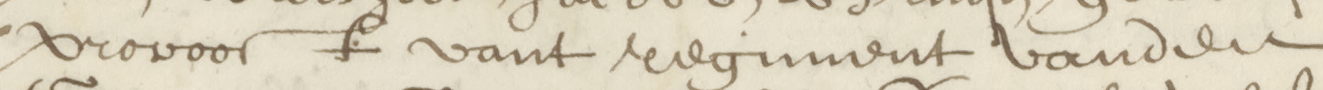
provoost vant regiment vanden
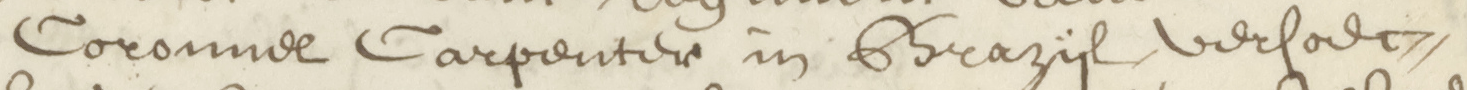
Coronnel Carpenter in Brazijl, versoec„
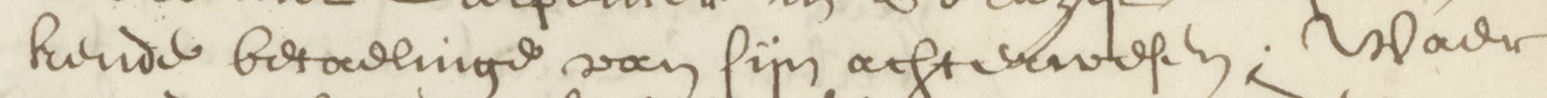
kende betaelinge van sijn achterwesen; Waer
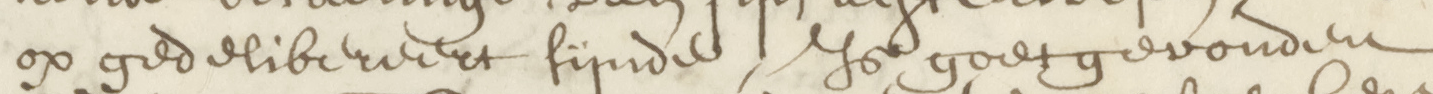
op gedelibereert sijnde, Is goetgevonden
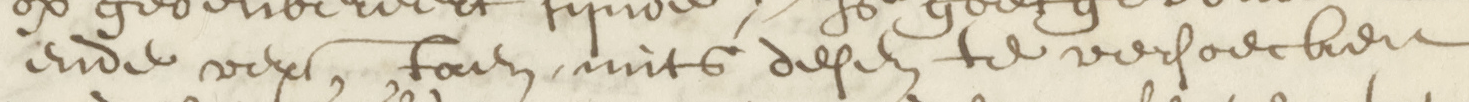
ende verstaen, mits desen te versoecken
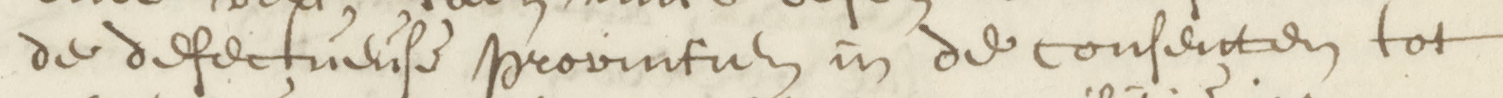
de defectueuse provintien in de consenten tot
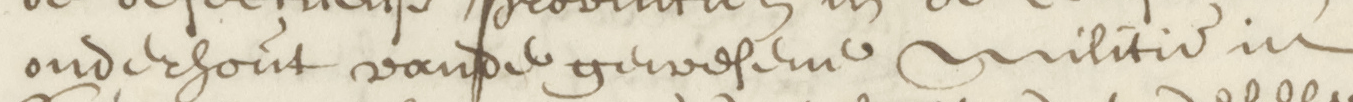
onderhout vande gewesene Militie in
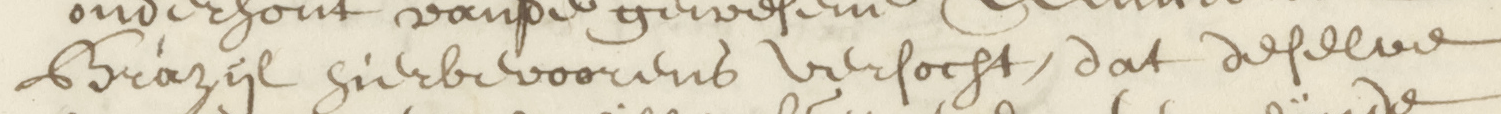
Brazijl hierbevoorens versocht, dat deselve
